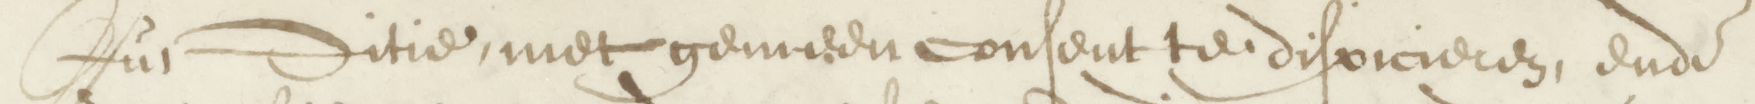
Justitie, met gemeen consent te dispicieren, ende
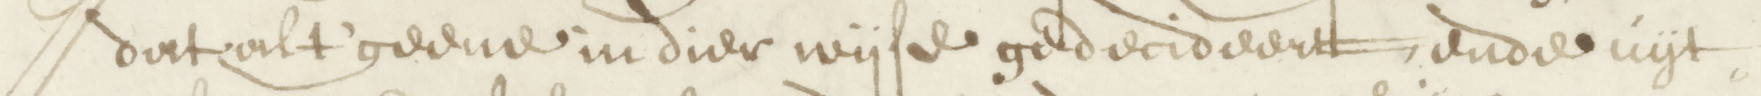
dat alt‛ geene in dier wijse gedecideert, ende uijt„
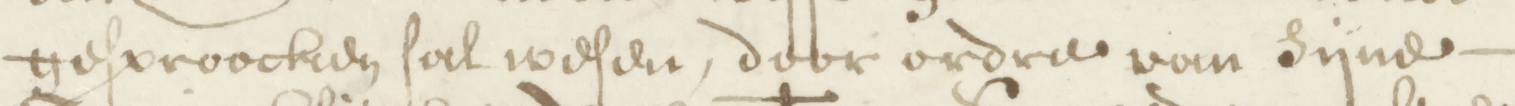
gesproocken sal wesen, door ordre van sijne -
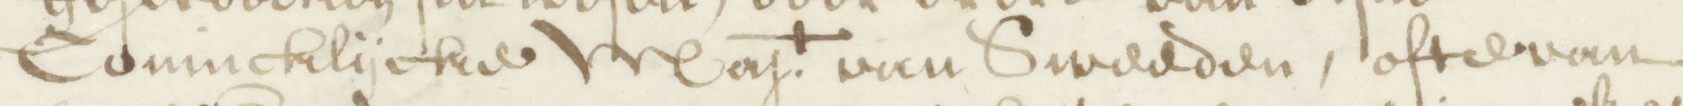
Conincklijcke Majt. van Sweeden, ofte van
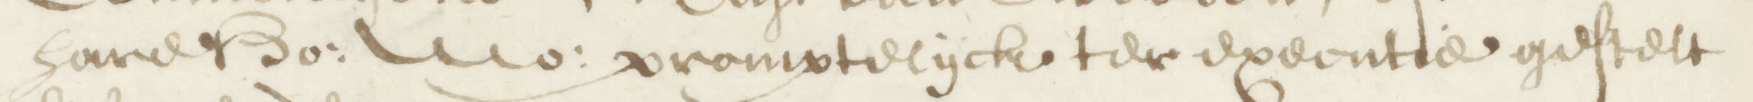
hare Ho:Mo: promptelijck ter executie gestelt
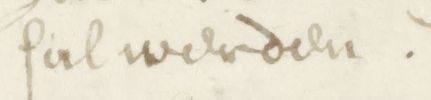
sal werden.
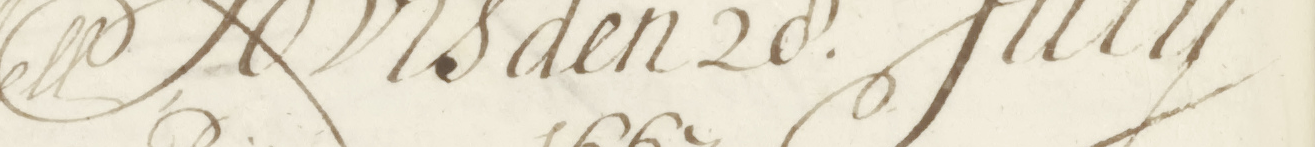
Jovis den 28en. Julij
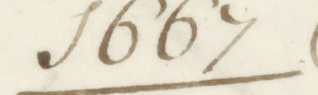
1667
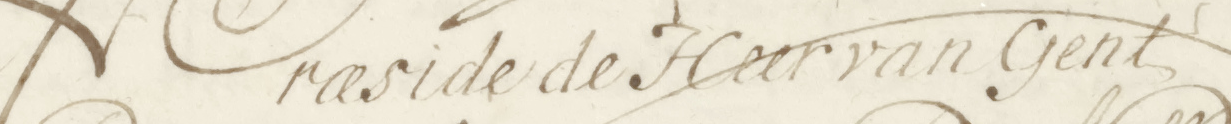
Præside de Heer van Gent.
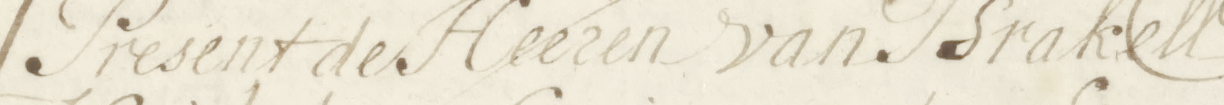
Present de Heeren van Brakell,
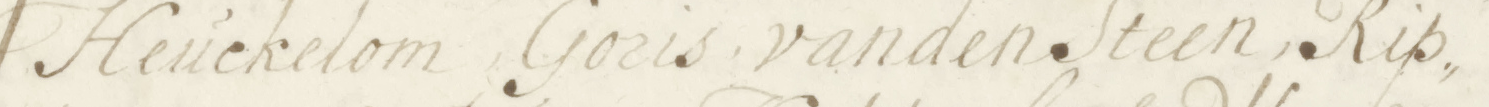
Heuckelom, Goris, van den Steen, Rip„
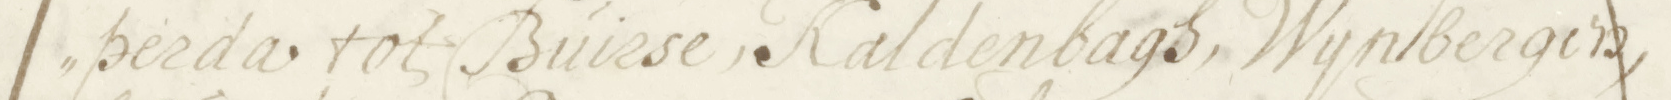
„perda tot Buirse, Kaldenbagh, Wynbergen,
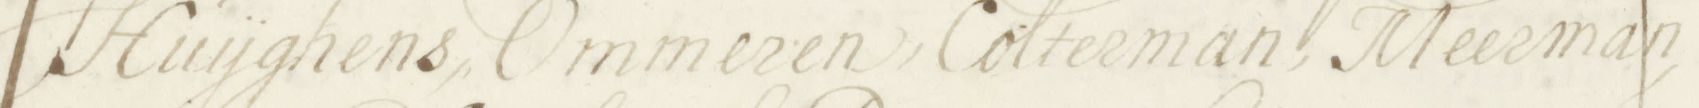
Huijghens, Ommeren, Colterman, Meerman,
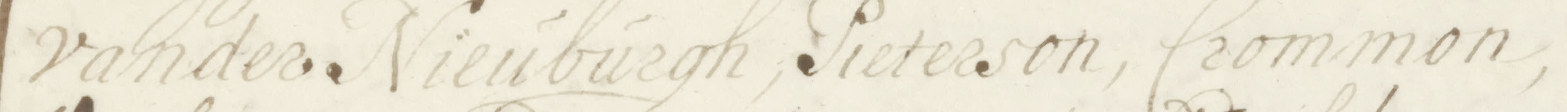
vander Nieuburgh, Pieterson, Crommon,
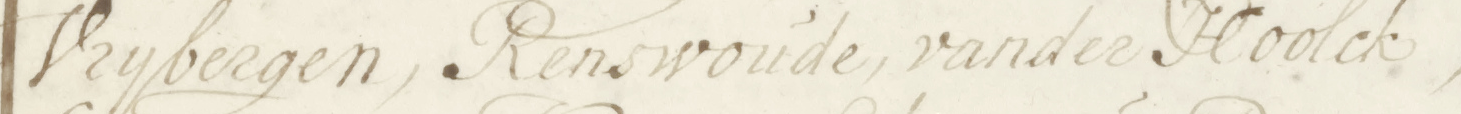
Vrybergen, Renswoude, vander Hoolck,
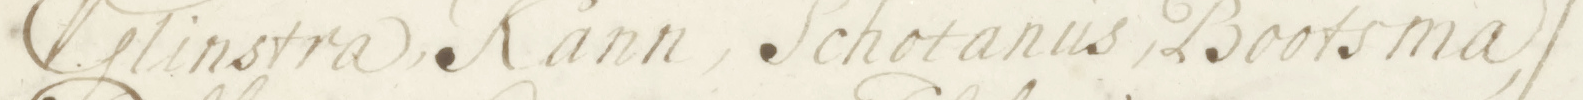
Glinstra, Kann, Schotanus, Bootsma,
